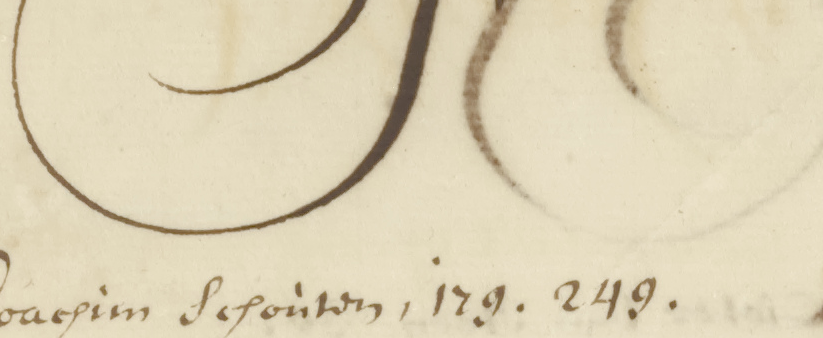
S
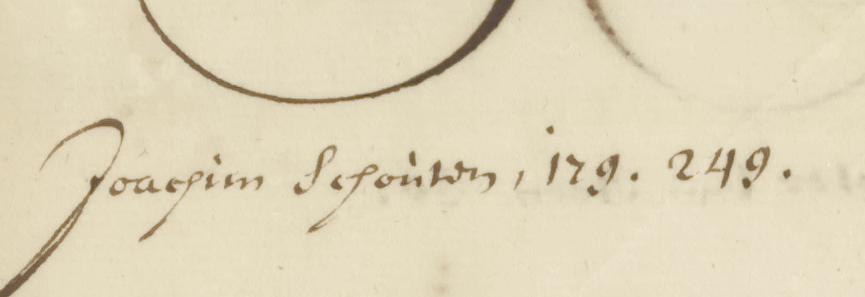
Joachim Schouten, 179, 249.
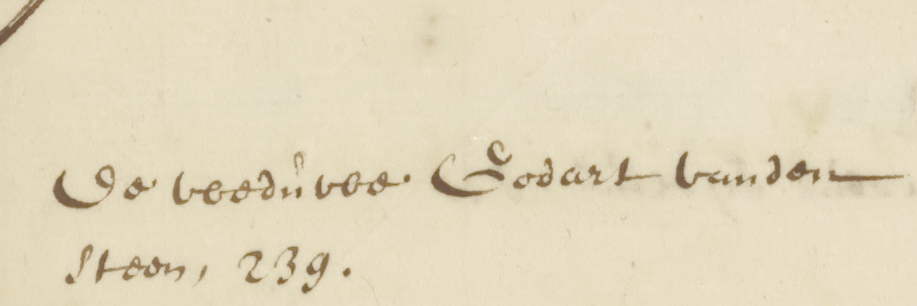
De weduwe Godart vanden
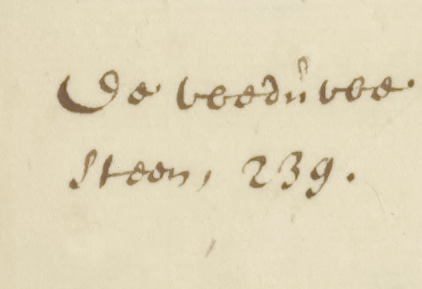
Steen, 239.
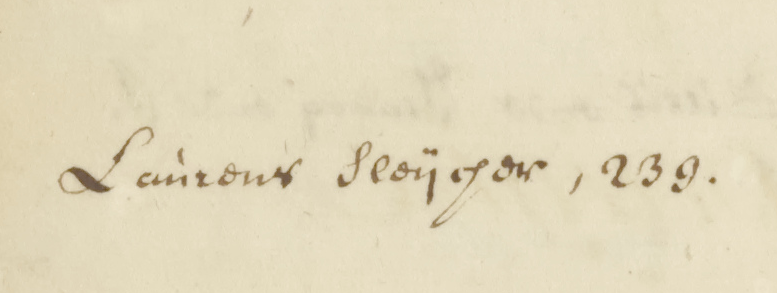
Laurens Sleijcher, 239.
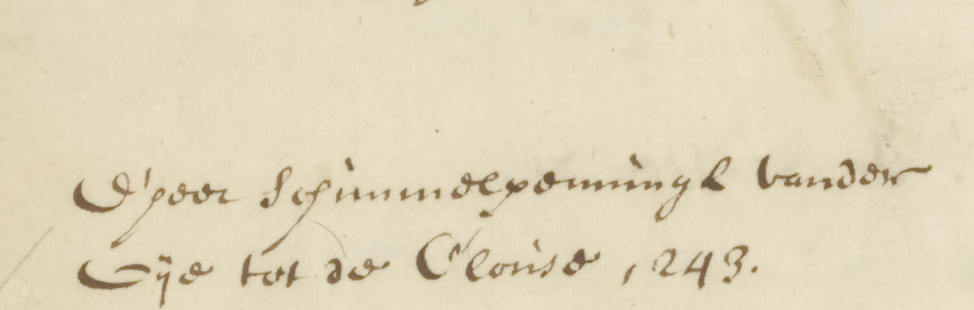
D'heer Schimmelpenningk vander
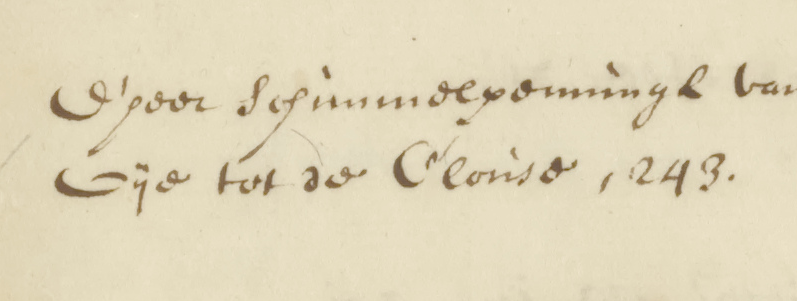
Oije tot de Clouse, 243.
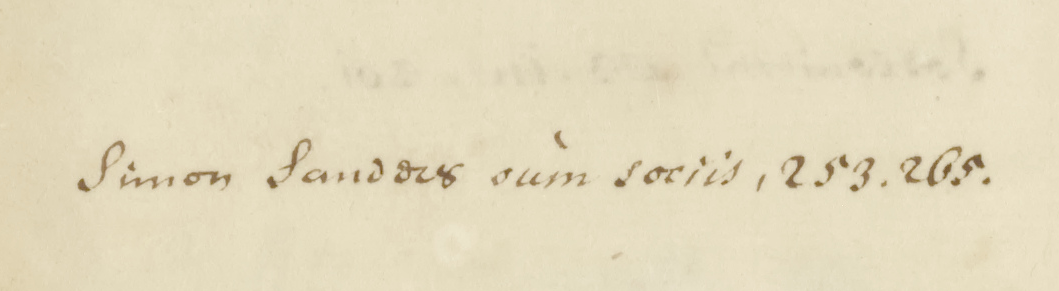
Simon Sanders sum sociis, 253, 265.
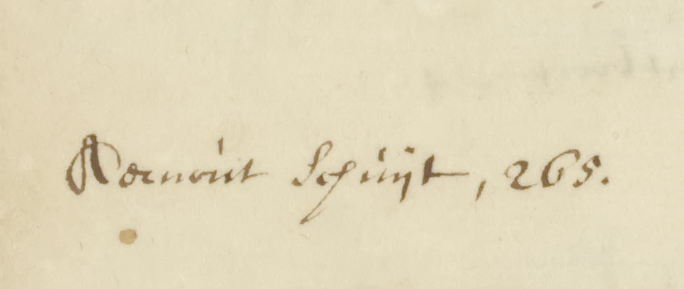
Aernout Schuijt, 265.
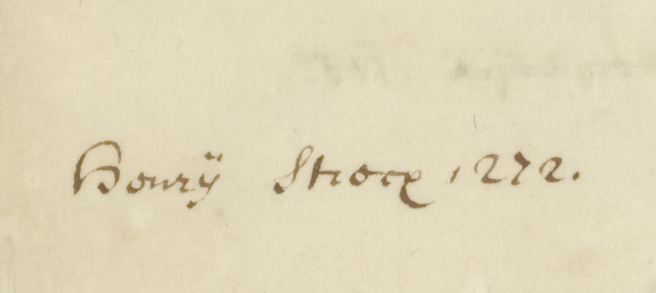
Henrij Strecx, 272.
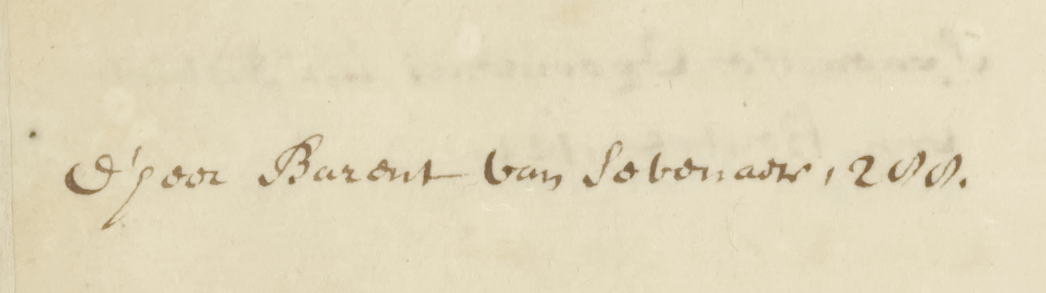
D'heer Barent van Sevenaer, 288.
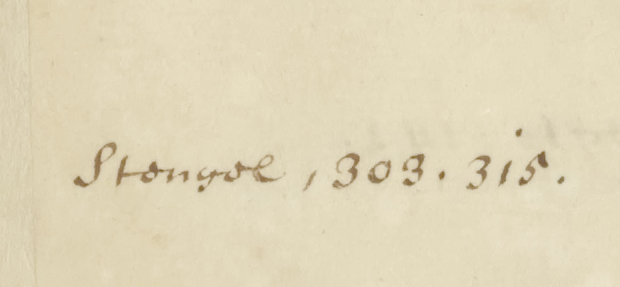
Stengel, 303, 315.
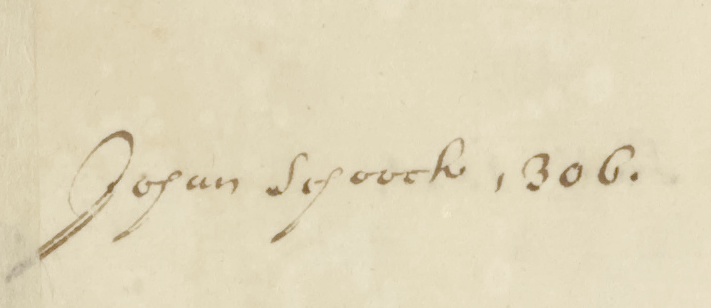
Johan Schoock, 306.
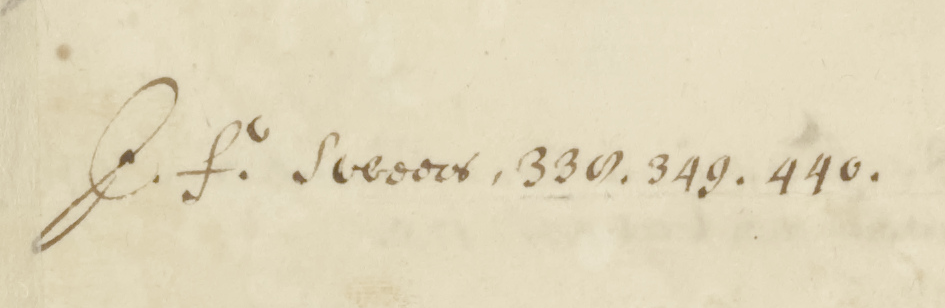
J.f. Sweers, 338, 349, 440.
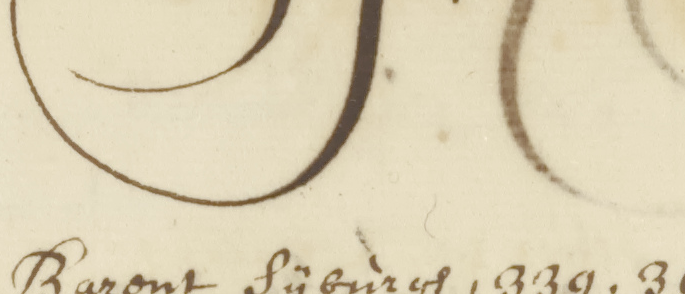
S
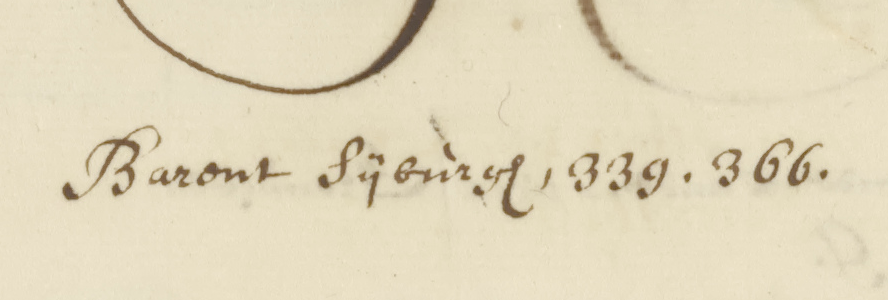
Barent Sijburgh, 339, 366.
